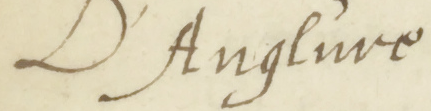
D'Anglure
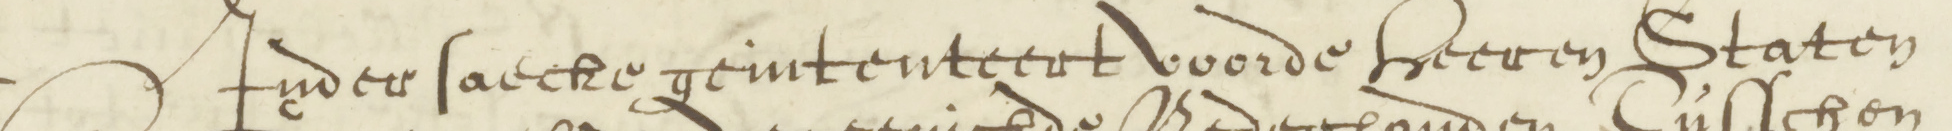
Inder saecke geintenteert voorde heeren Staten
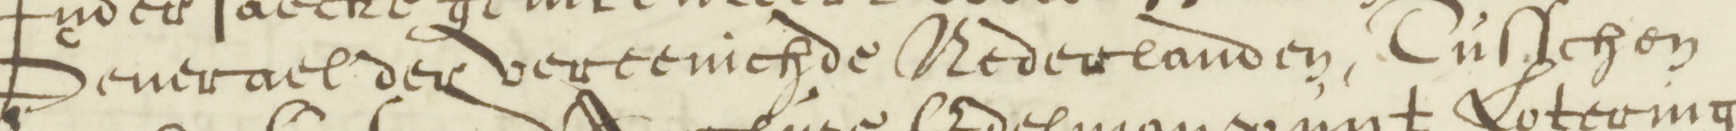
Generael der Vereenichde Nederlanden, Tusschen
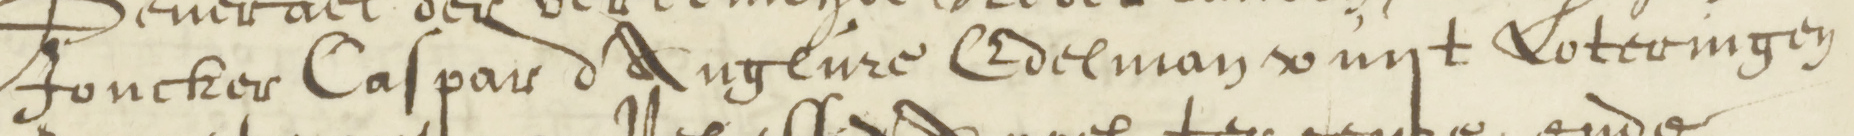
Joncker Caspar d'Anglure Edelman vuyt Loteringen
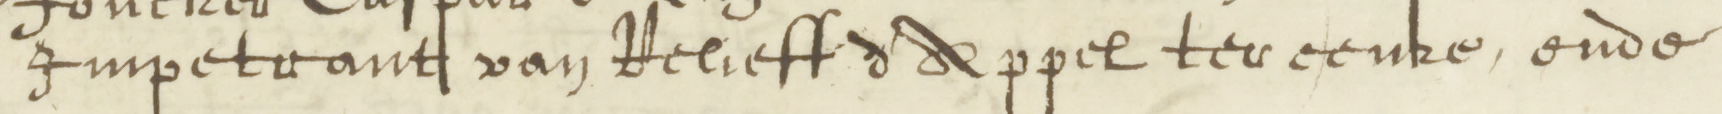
Impetrant van Relieff d'Appel ter eenre, ende
